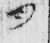月
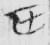甲
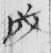戌
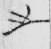之
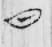日
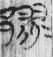鄝
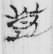莫
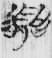囂
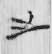之
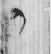人
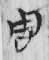周
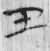壬
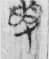受
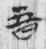○（期）
